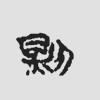則
